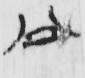公
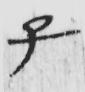子
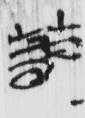○（春）
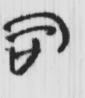司
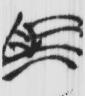馬
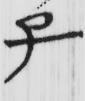子
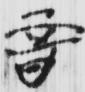音
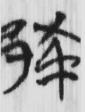○（蔡）
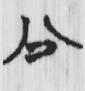公
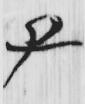子
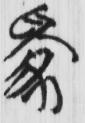○（家）
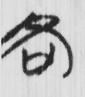各
